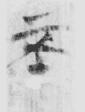不
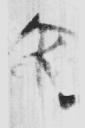夭
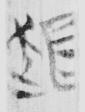𧻚
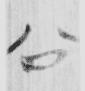公
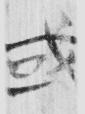或
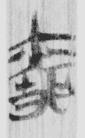{尒䎽}
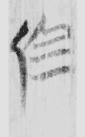於
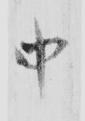中
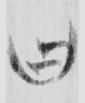曰
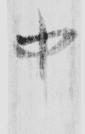中
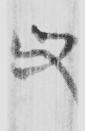父
